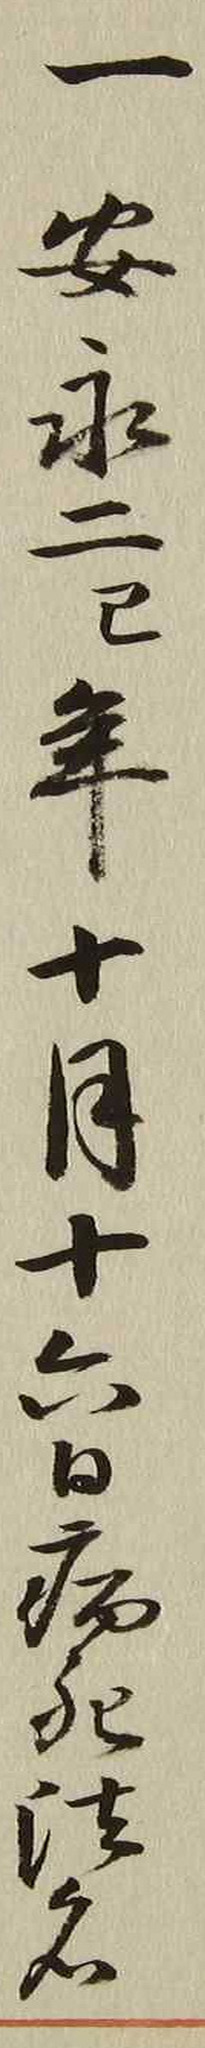一安永二巳年十月十六日病死法名
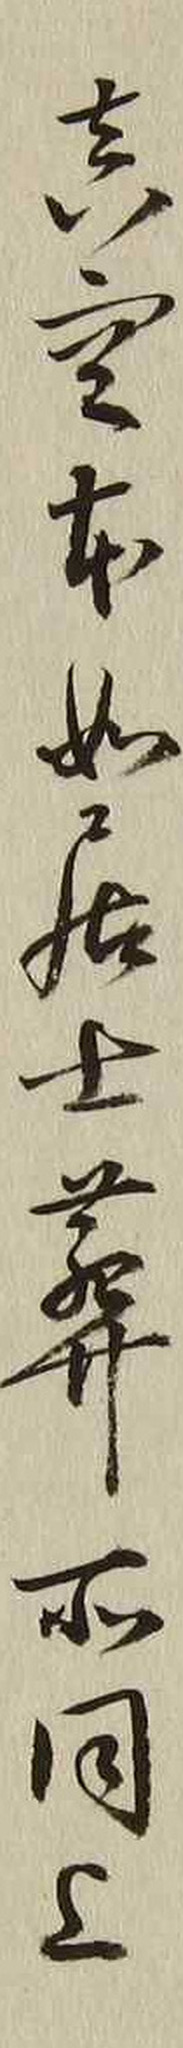真空本如居士葬所同上
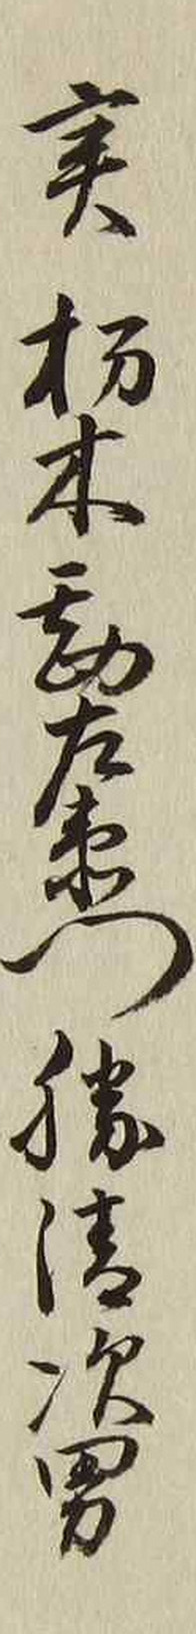実栃木勘左衛門勝清次男
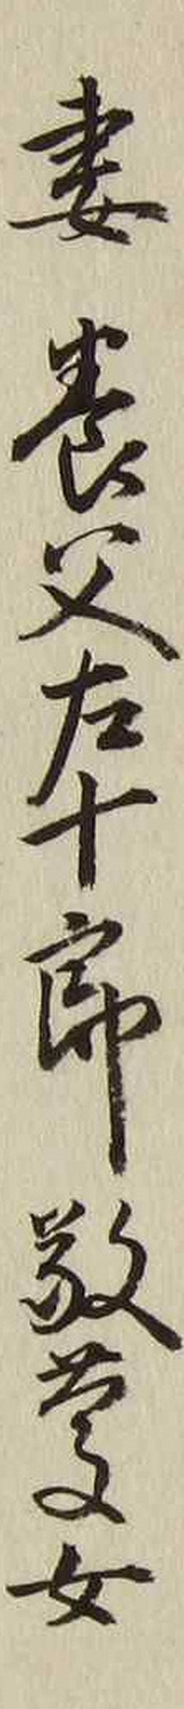妻養父左十郎敬慶女

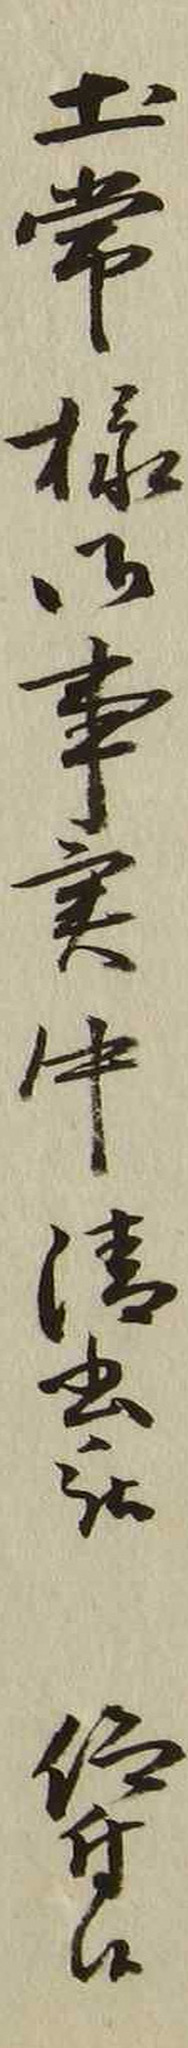土常様御事実中清書被仰付候
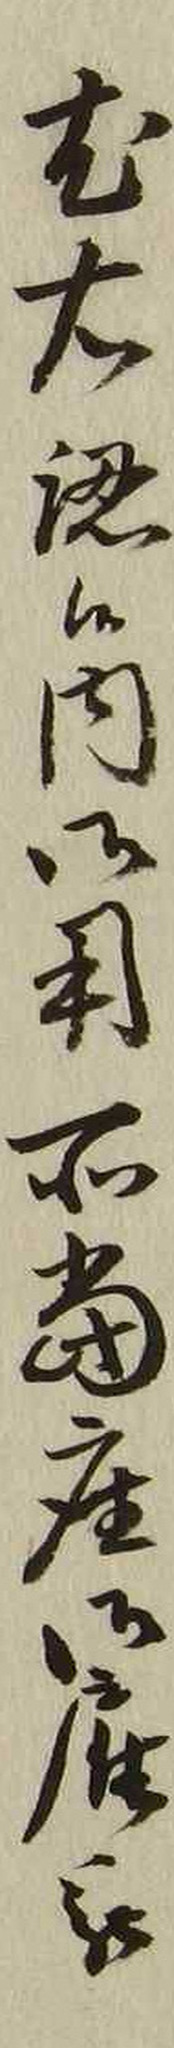尤右認候内御用所当座御雇被
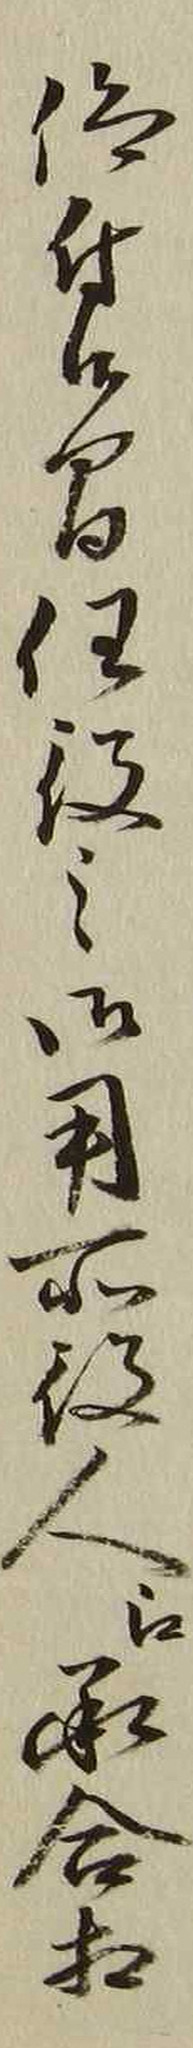仰付候間任役之御用所役人江承合相
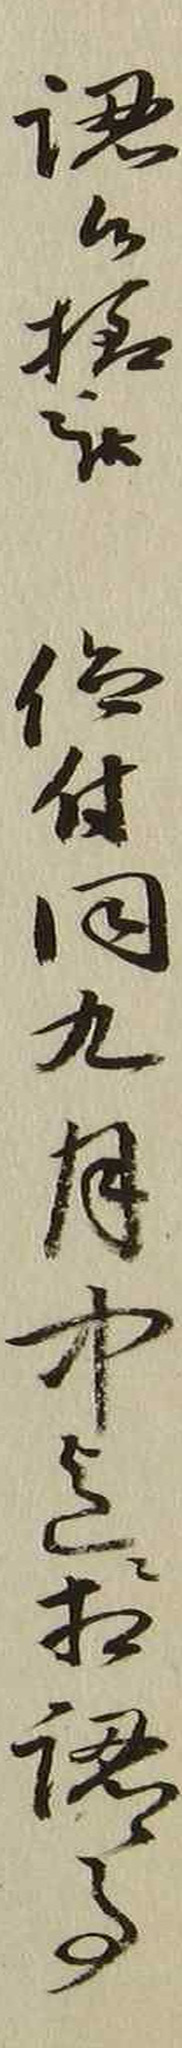認候様被仰付同九月中迄ニ相認候事
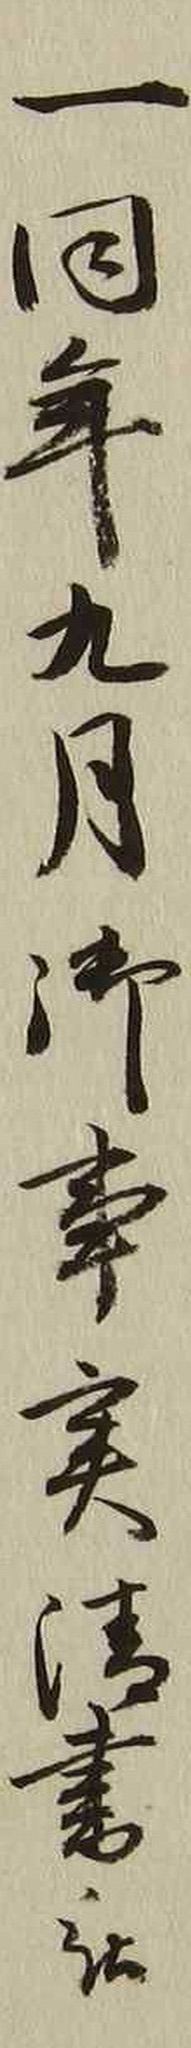一同年九月御事実清書被
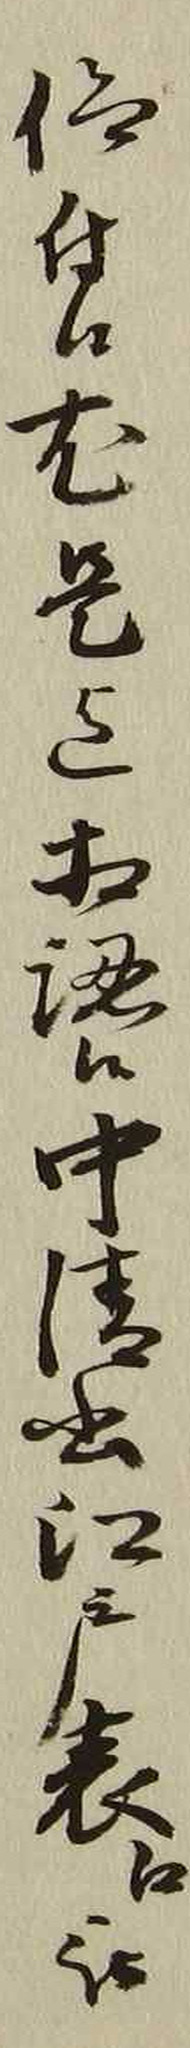仰付候尤是迄相認候中清書江戸表江被
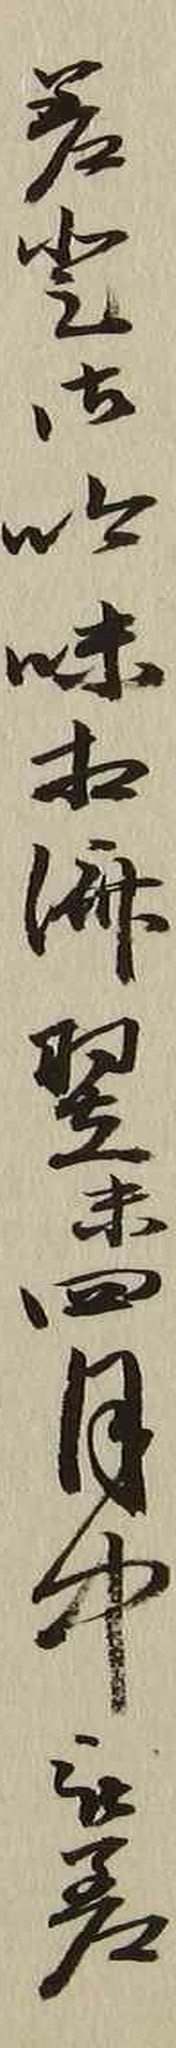差登御吟味相済翌未四月中被差
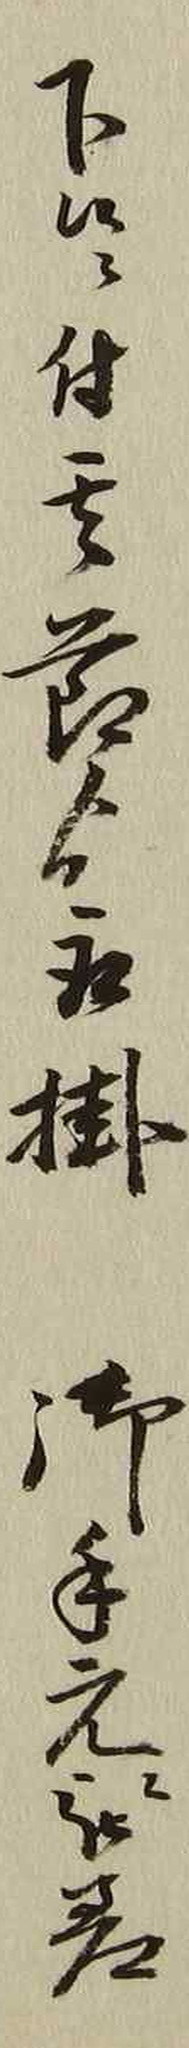下候ニ付其節ゟ取掛御手元ニ被差
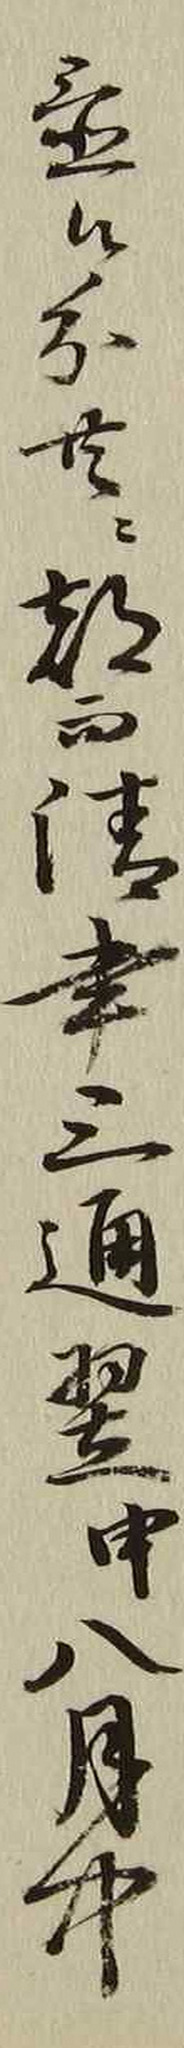置候分共ニ都而清書三通翌申八月中
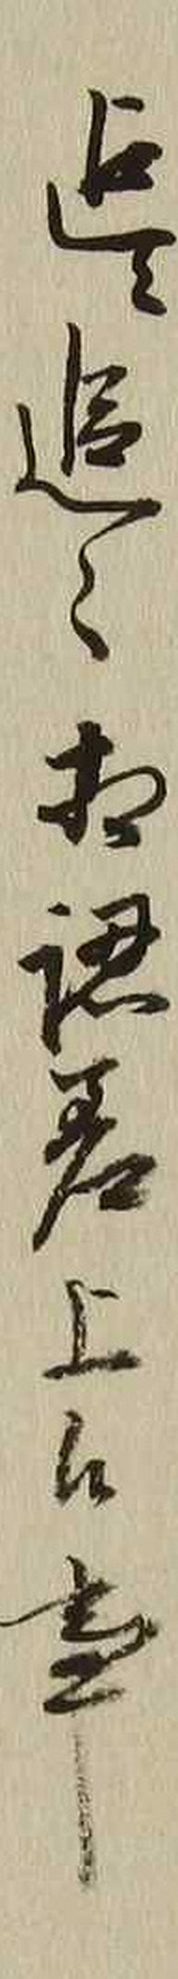迄ニ追々相認差上候事
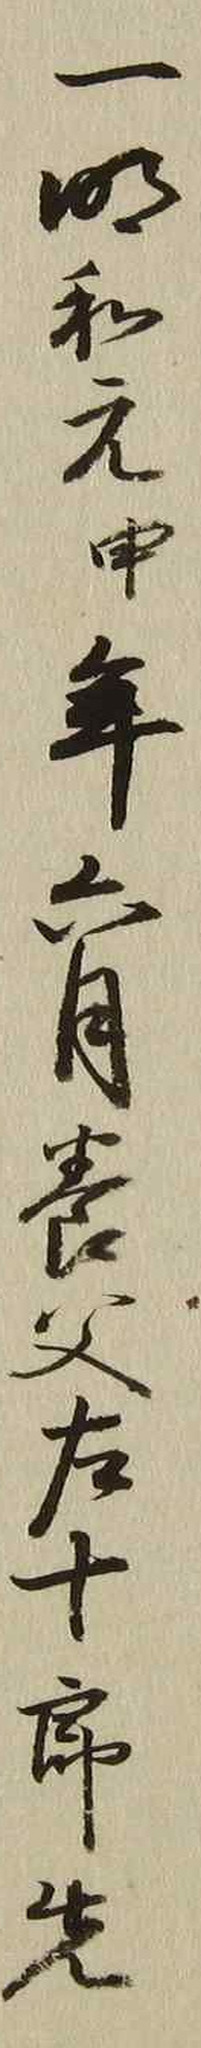一明和元申年六月養父左十郎先
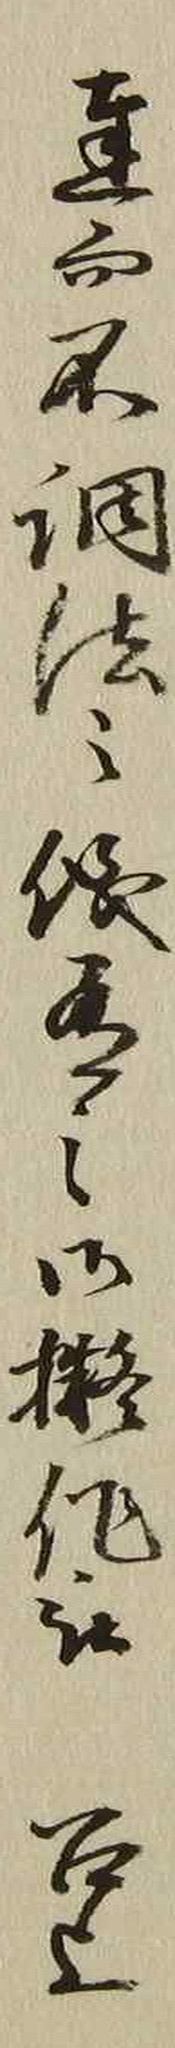達而不調法之儀有之御擬作被召上
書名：諸士系譜　巻之61　と之部4
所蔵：会津若松市立会津図書館
